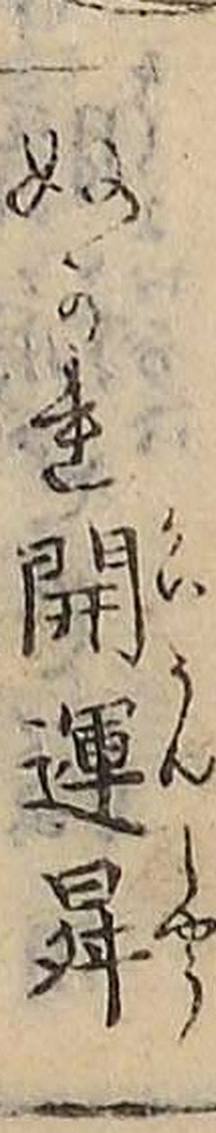ぬかれ開運昇
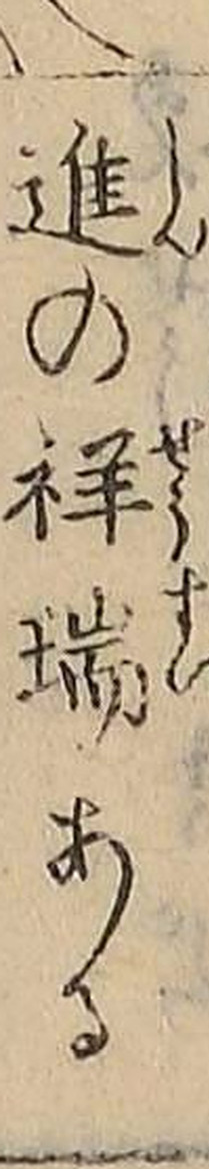進の祥端ある
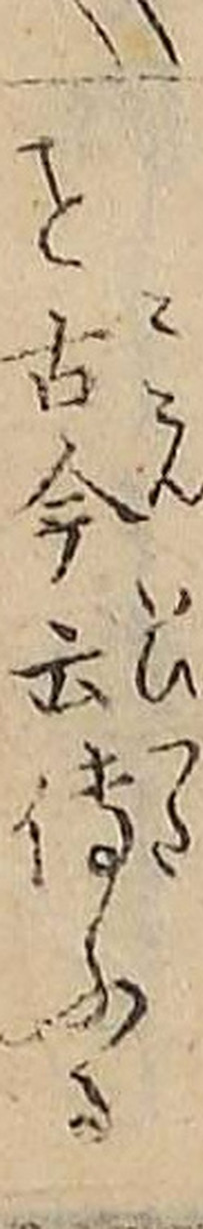こと古今云伝ふる
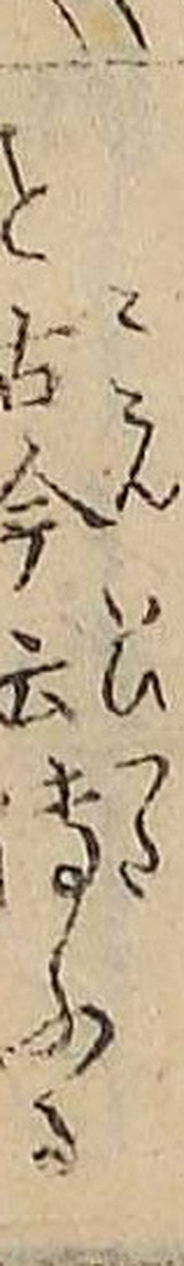こと古今云伝ふる
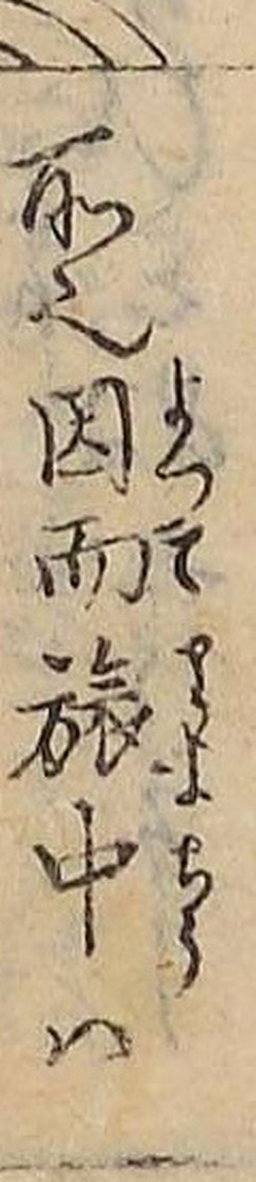所也因而旅中は
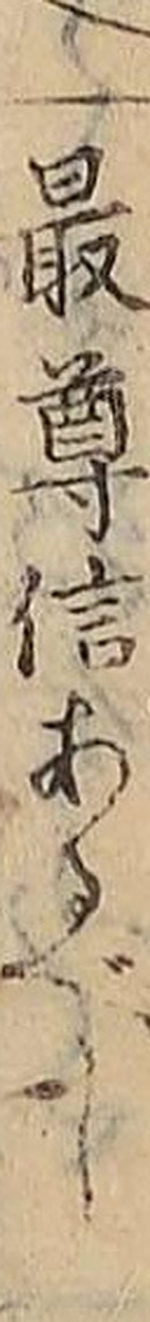最尊信あるべし

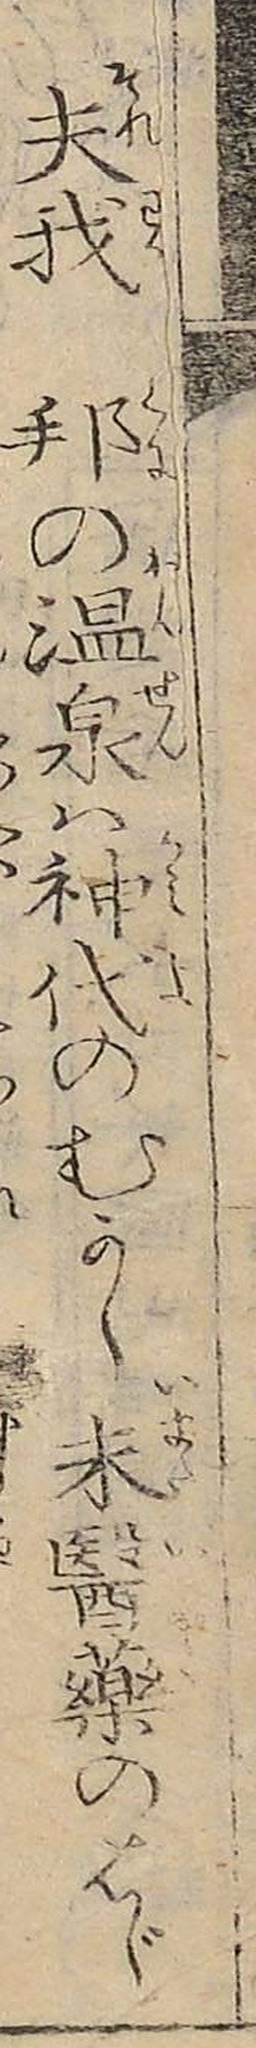夫我邦の温泉は神代のむかし未医薬のはじ
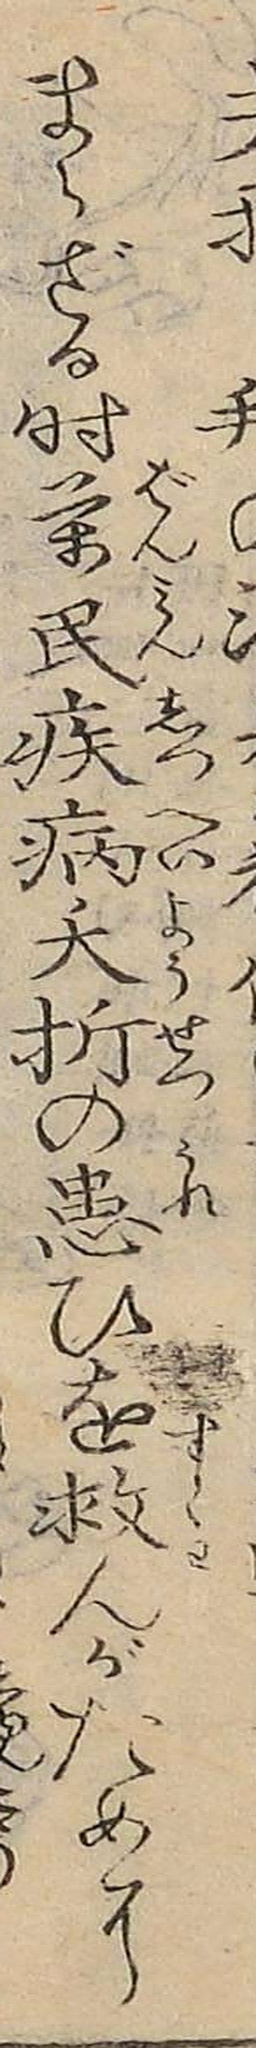まらざる時万民疾病夭折の患ひを救んがために
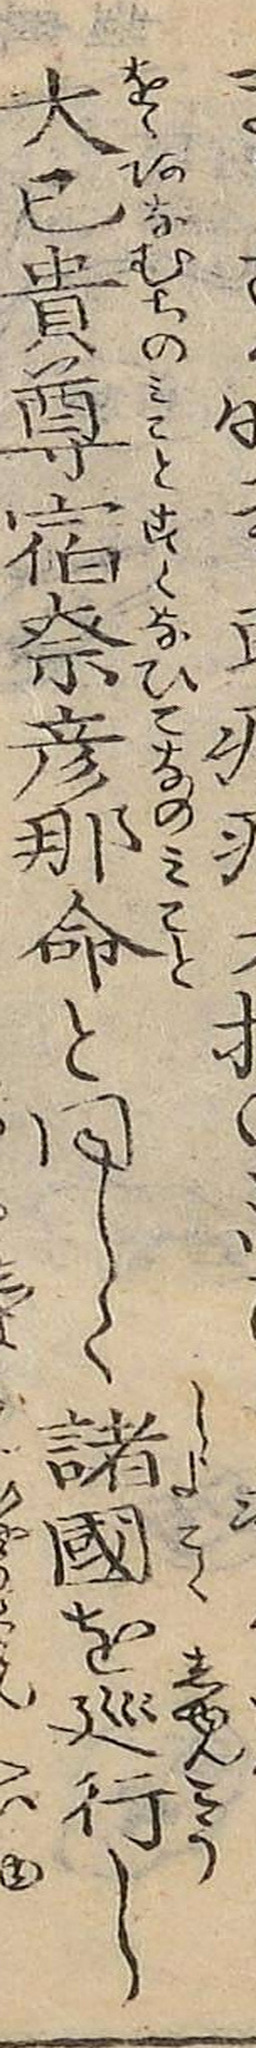大已貴尊宿奈彦那命と同しく諸国を巡行し
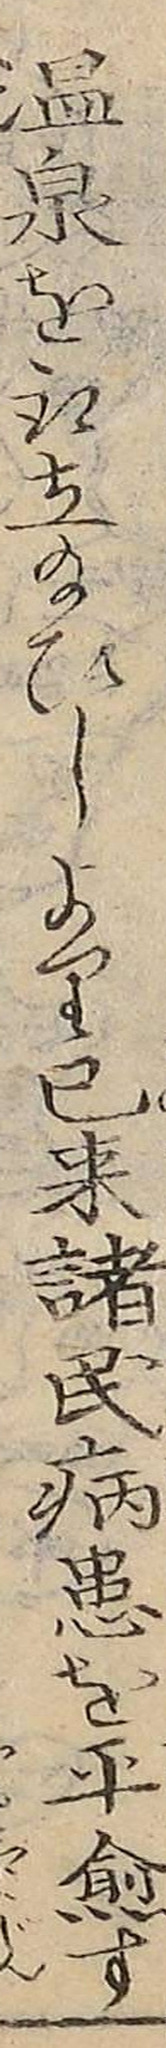温泉を取立給ひしより已来諸民病患を平愈す
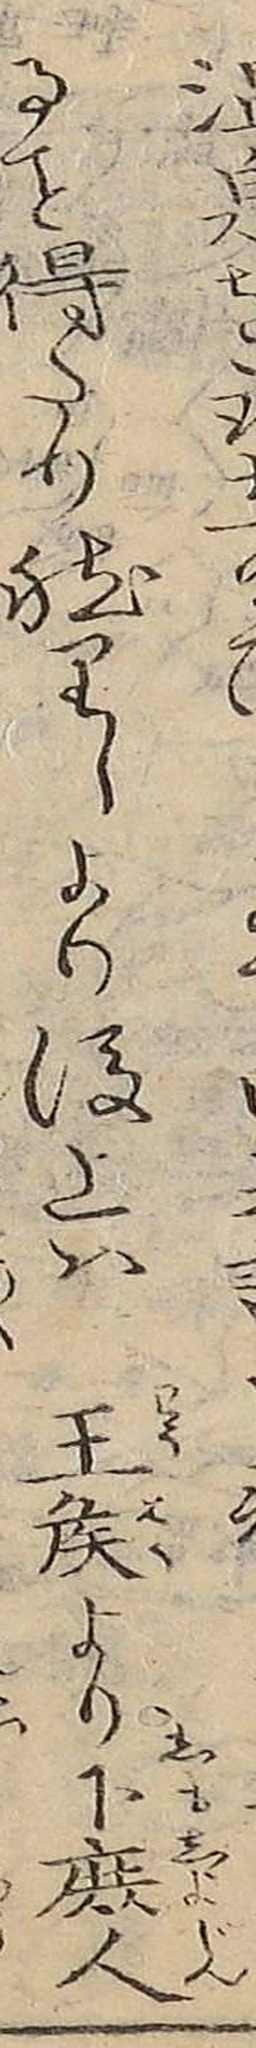ること得たり然りしより後上は王侯より下庶人
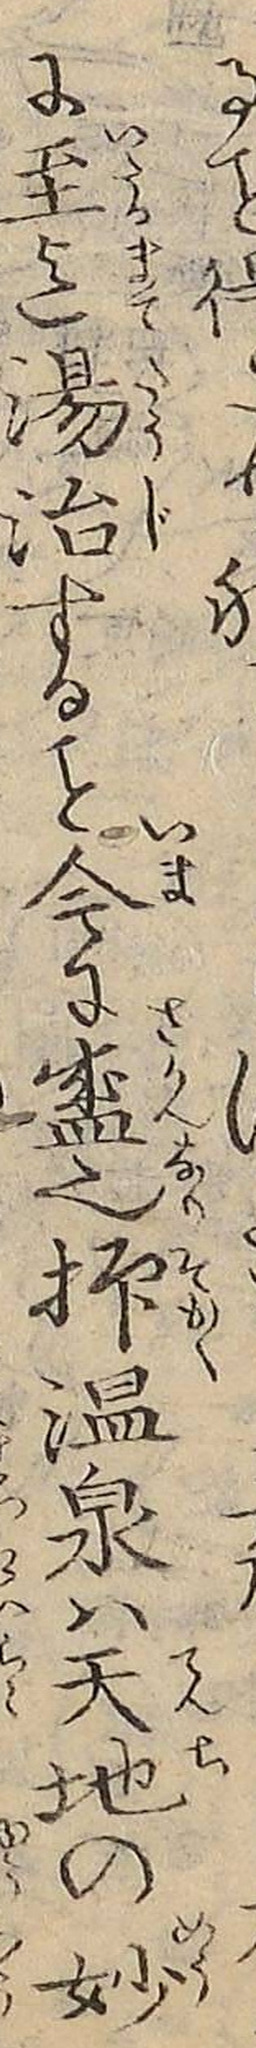に至迄湯治すること今に盛也抑温泉は天地の妙
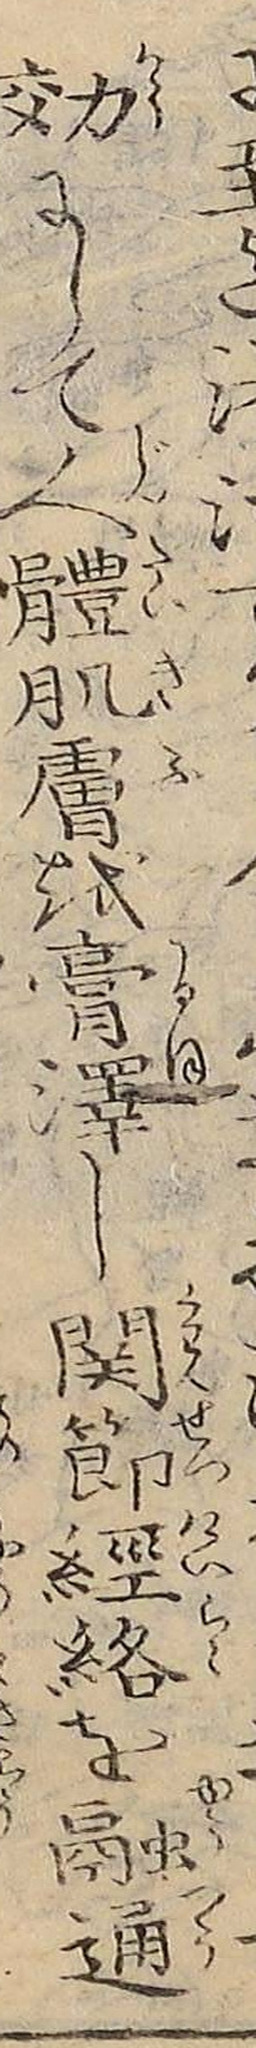効にして人体肌膚を膏沢し関節経絡を融通
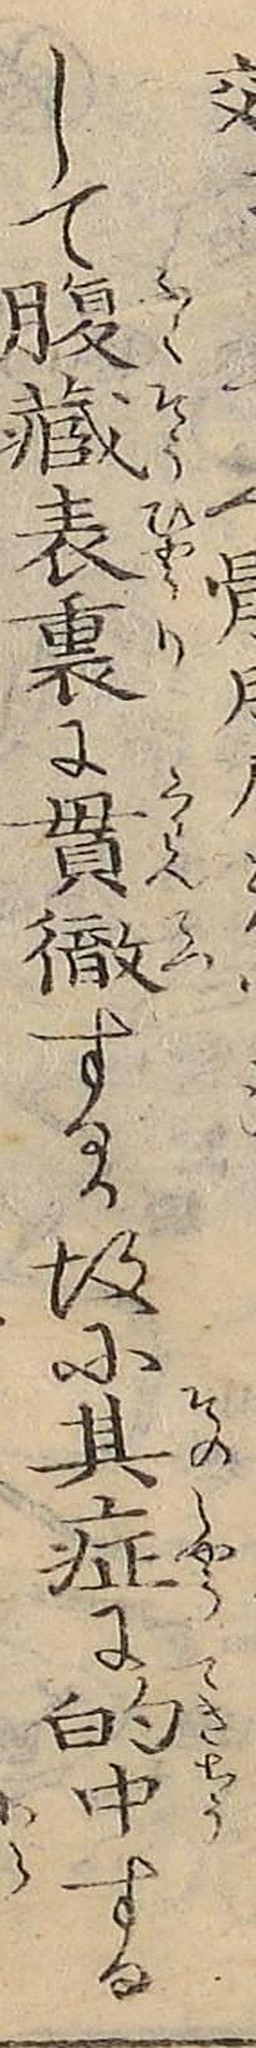して腹蔵表裏に貫徹するか故に其症に的中する
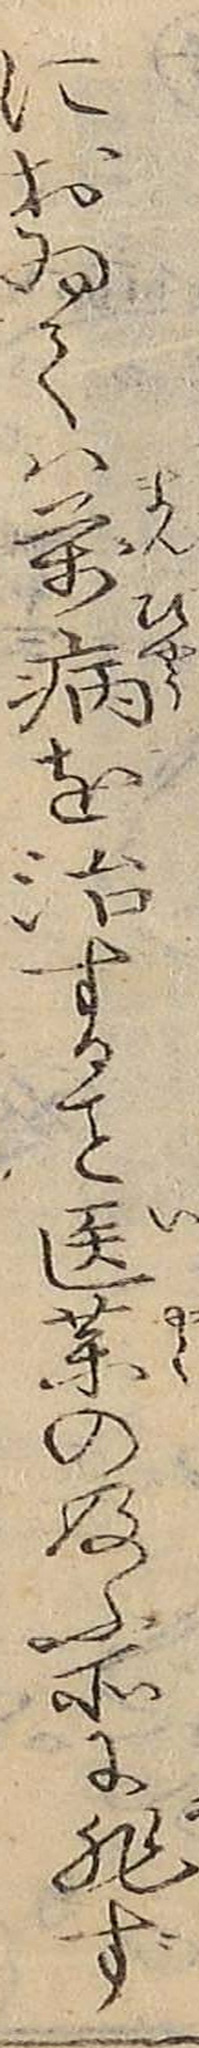におゐては万病を治すること医薬の及ふ所に非ず
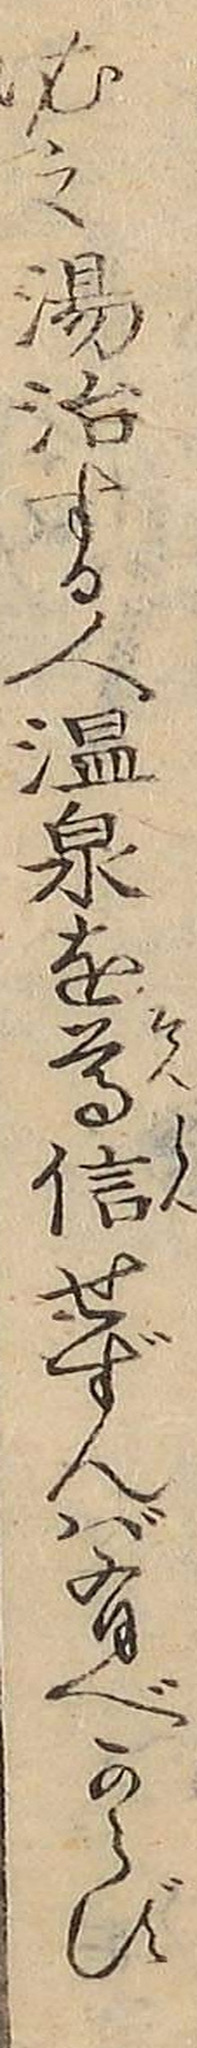依之湯治する人温泉を尊信せずんば有べからず
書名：旅行用心集
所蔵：神戸大学附属図書館 国文学研究資料館
